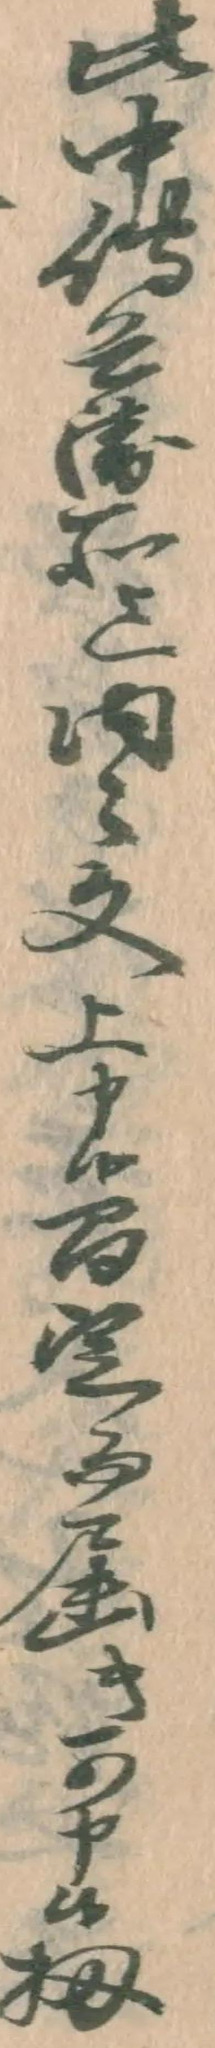此中伝兵衛所迄内々文上申候間定而届き可申候扨
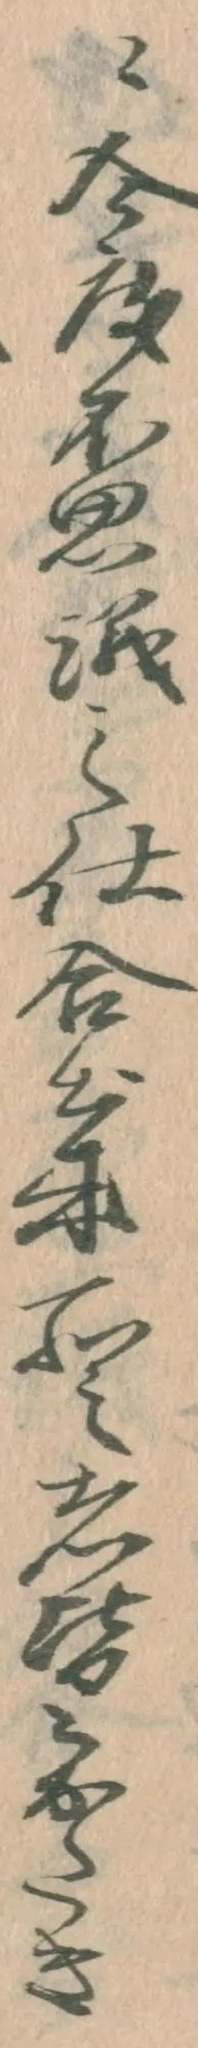々今度不思議之仕合出来所之者皆々かたき
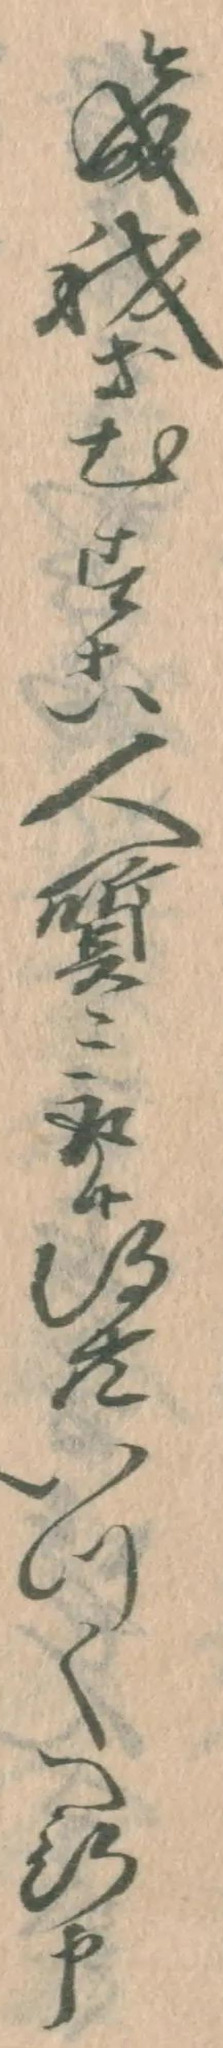被成我等む春古人質に取候得共い川くへ行申
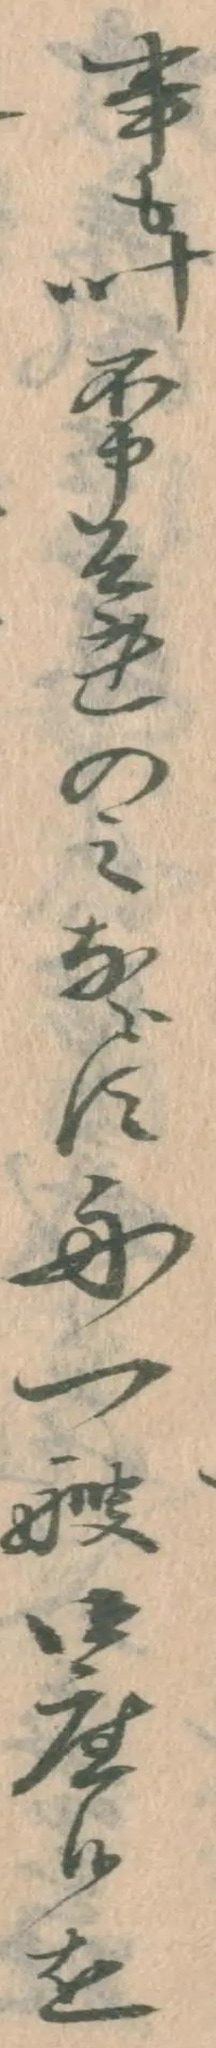事も叶不申そ連のみなら須舟一艘御座候を
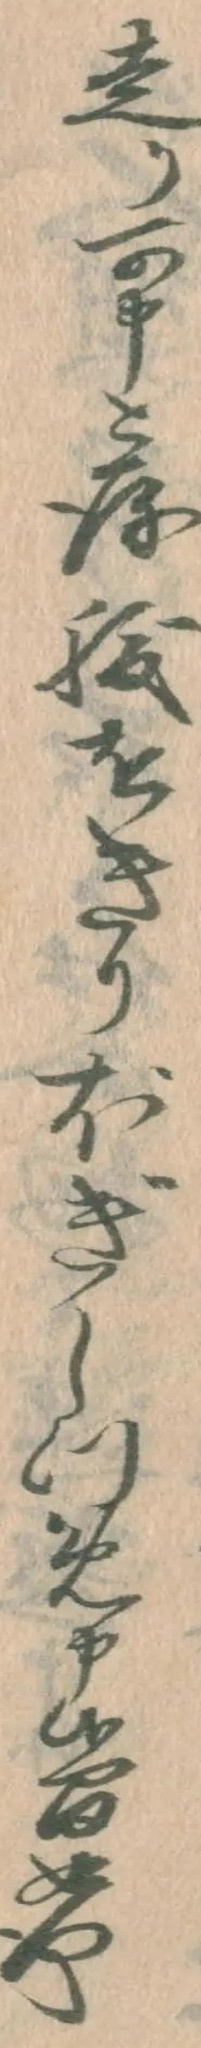走り可申と存紙をきり本ぎし川免申候間如何
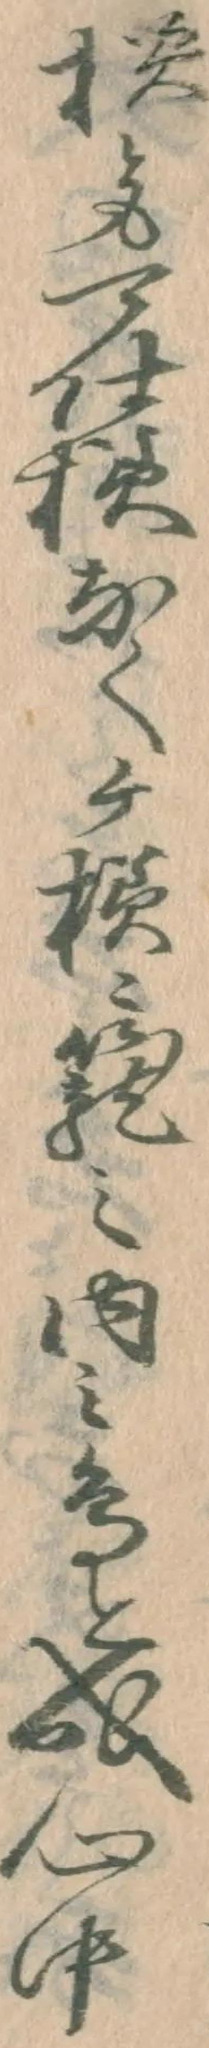様とも可仕様なくけ様に籠之内之鳥と成心中
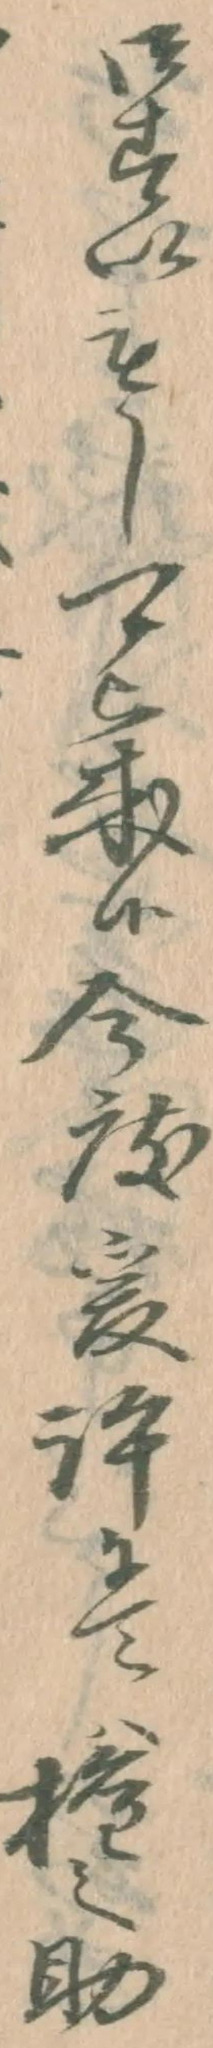御春以もし可被来候今度爰許尓ては権之助
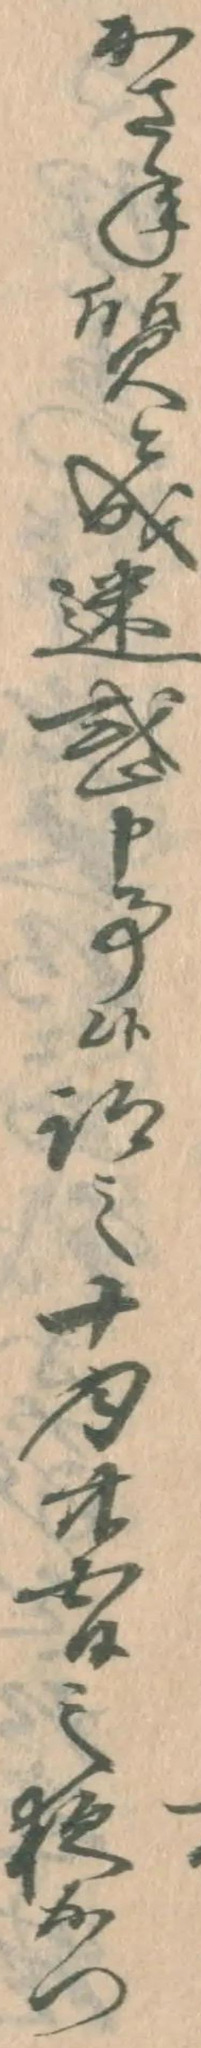かさ年質被成迷惑申事候跡之十月廿五日之夜かつ

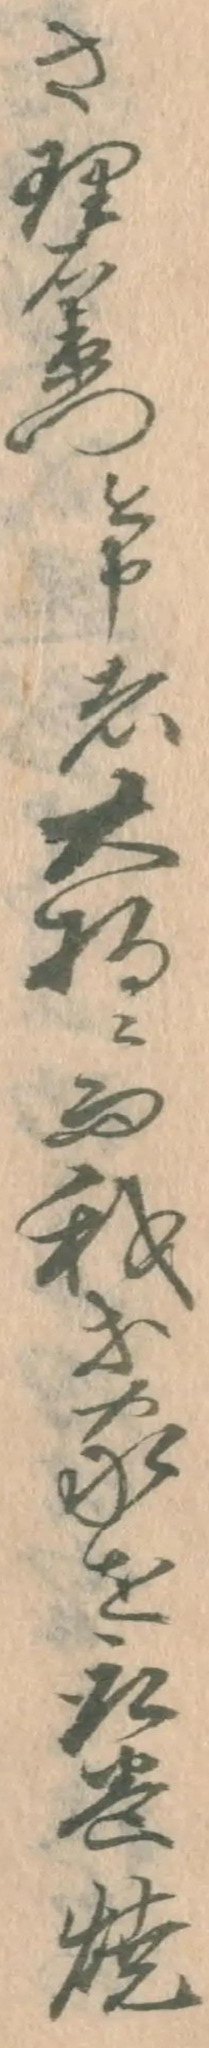さ理右衛門と申者大将に而我等家を取巻焼
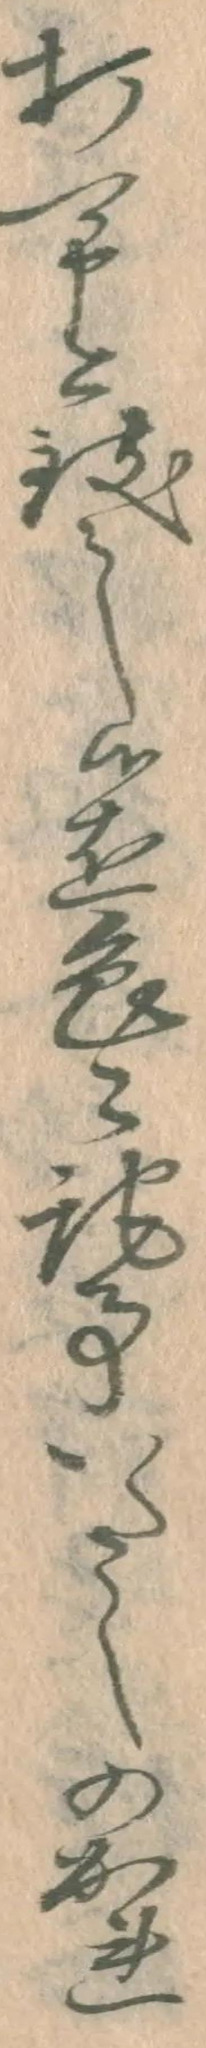打可申と致し候を色々詫事いたしの加連
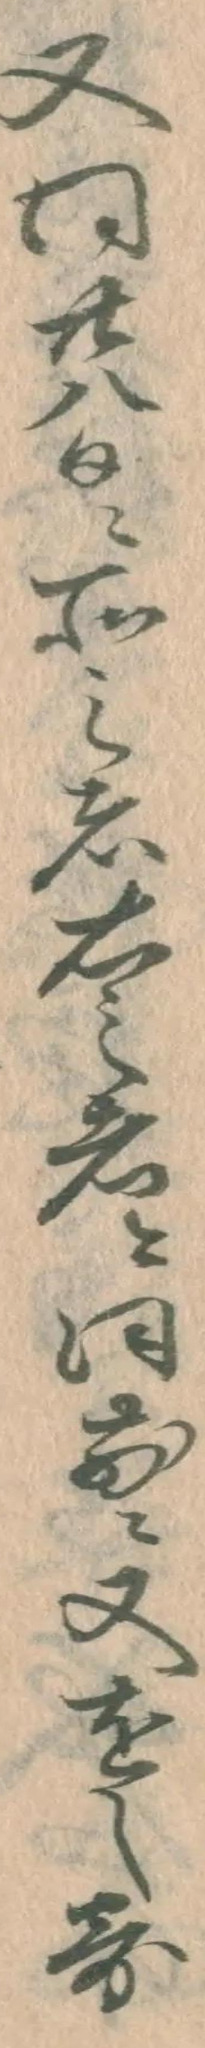又同廿八日に所之者右之者と同前に又をし寄
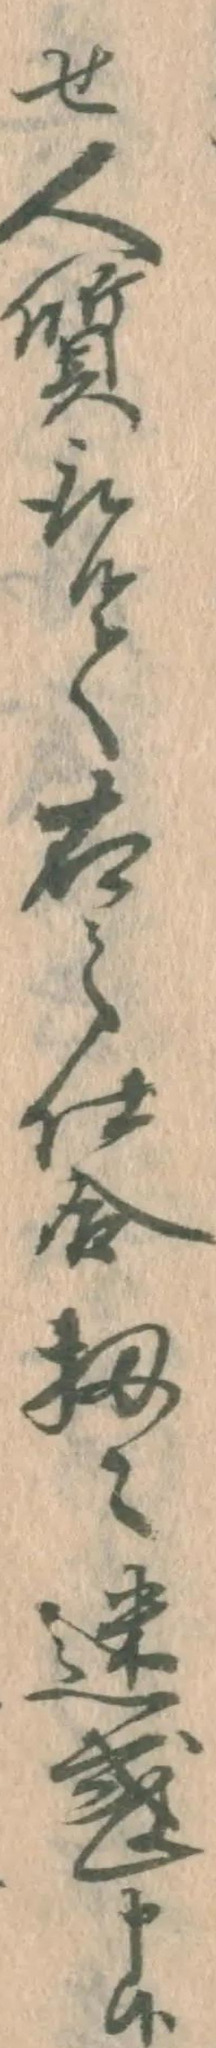せ人質取候て右之仕合扨々迷惑申候
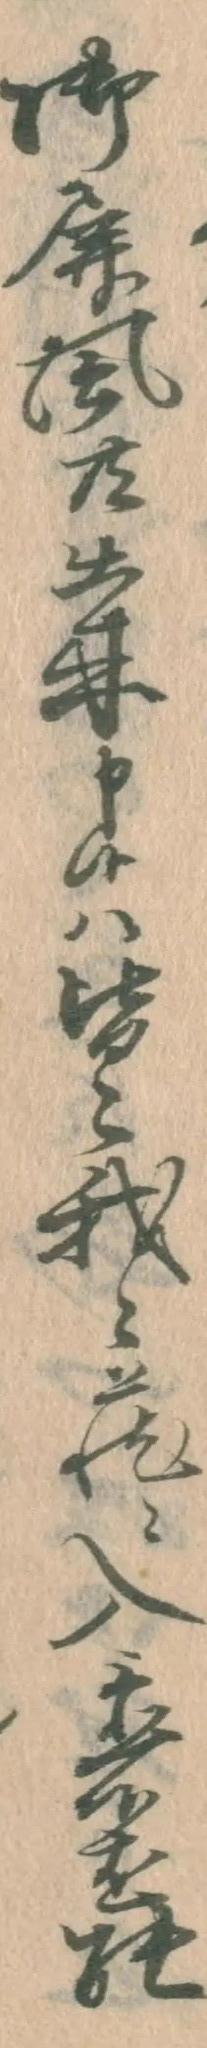一御屏風共出來申候は皆々我々蔵に入置候を能
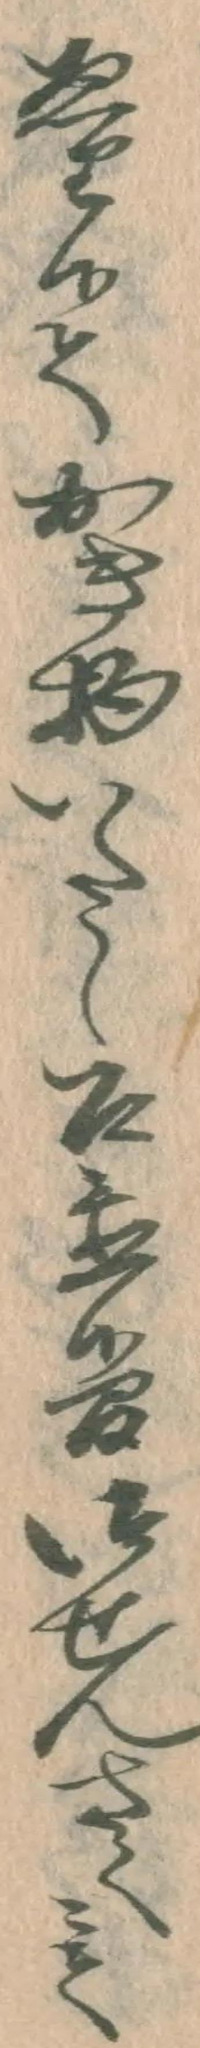怒里候てかき物致し召置候間御せんさくにて
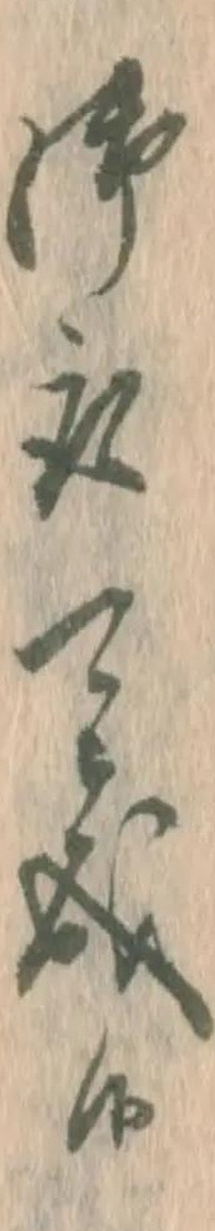御取可被成候
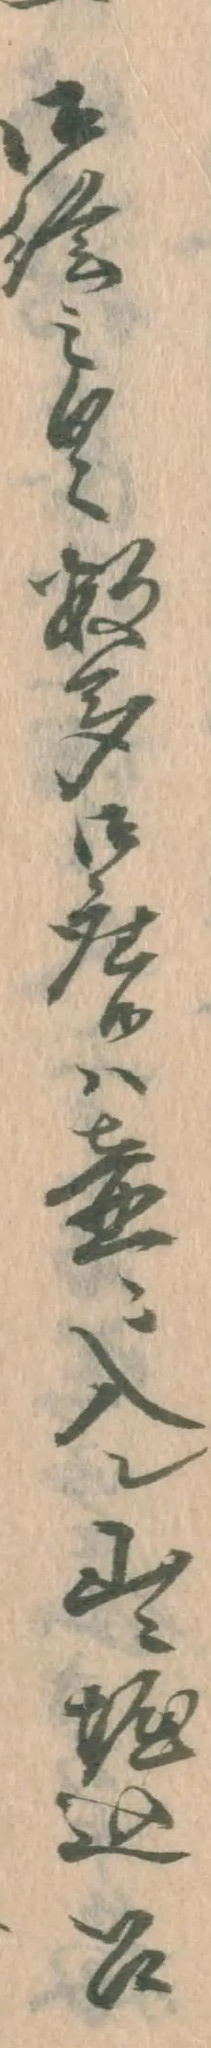一御絵之具数多御座候は壺に入れ山に堀込召
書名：切支丹御退治記 49巻. [5]
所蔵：国立国会図書館 National Diet Library, JAPAN
